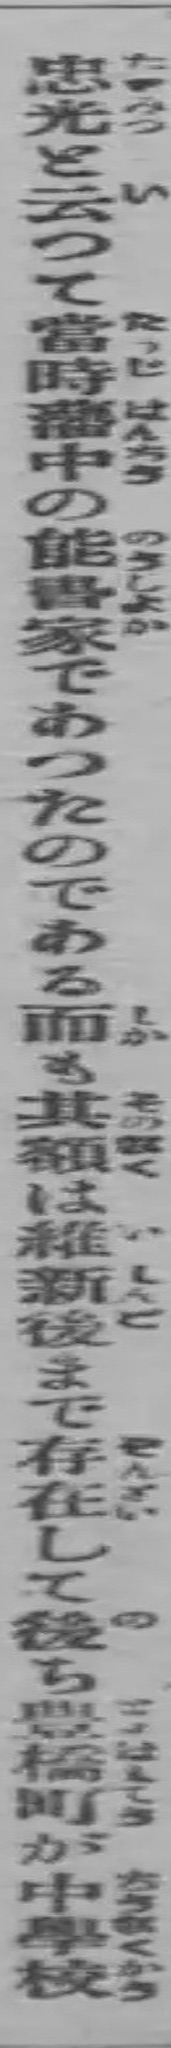忠光と云つて当時藩中の能書家であつたのである而も其額は維新後まで存在して後ち豊橋町が中学校
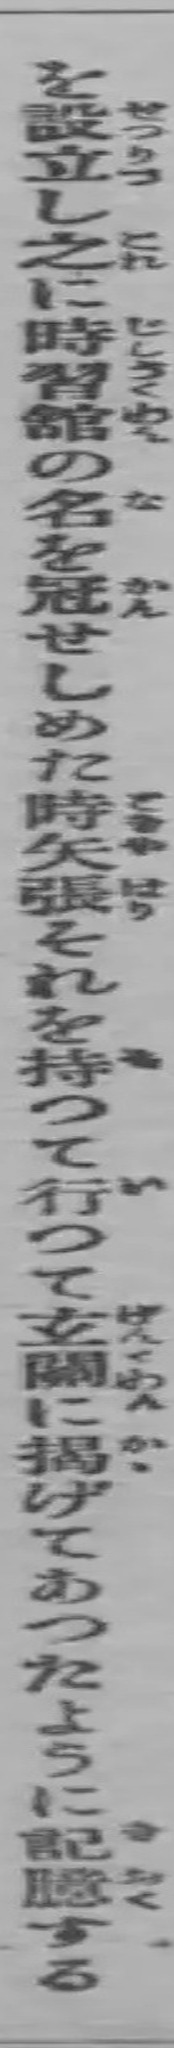を設立し之に時習館の名を冠せしめた時矢張それを持つて行つて玄関に掲げてあつたように記憶する
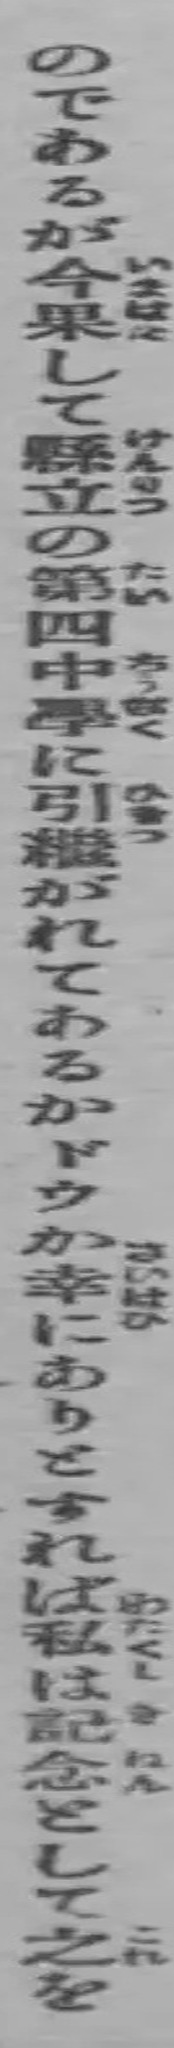のであるが今果して県立の第四中学に引継がれてあるかドウか幸にありとすれば私は記念として之を
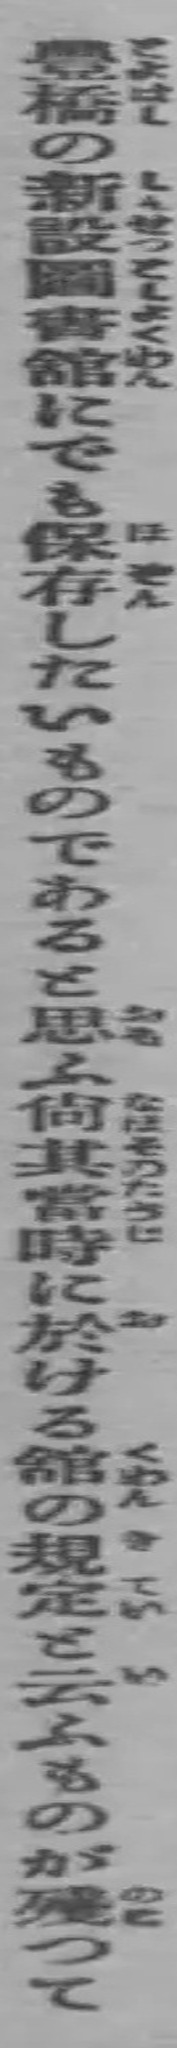豊橋の新設図書館にでも保存したいものであると思ふ尚其当時に於ける館の規定と云ふものが残つて

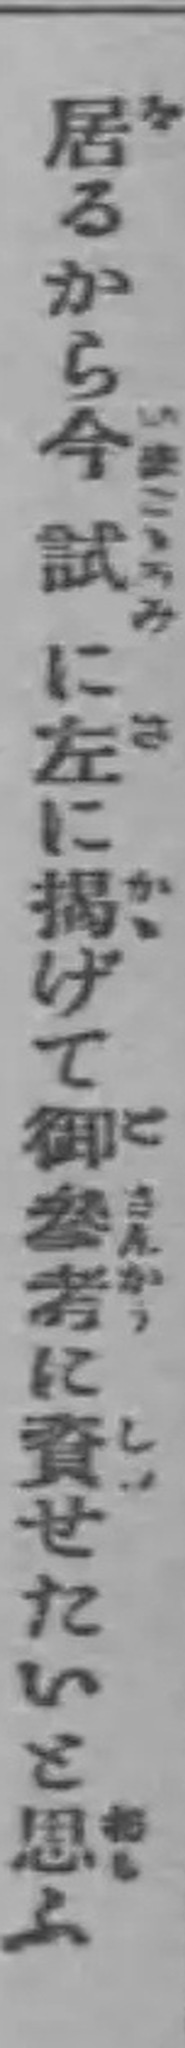居るから今試に左に掲げて御参考に資せたいと思ふ
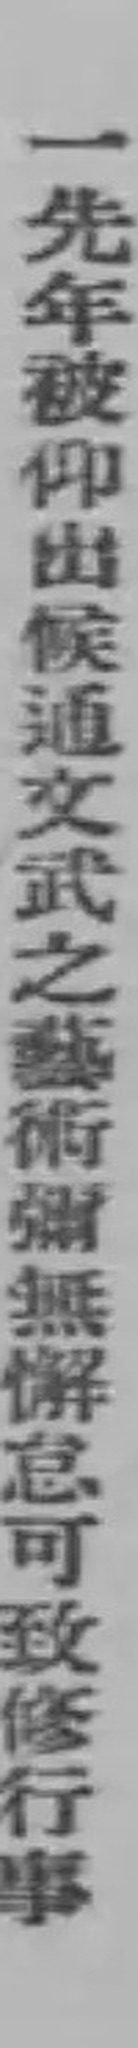一先年被仰出候通文武之芸術弥無懈怠可致修行事
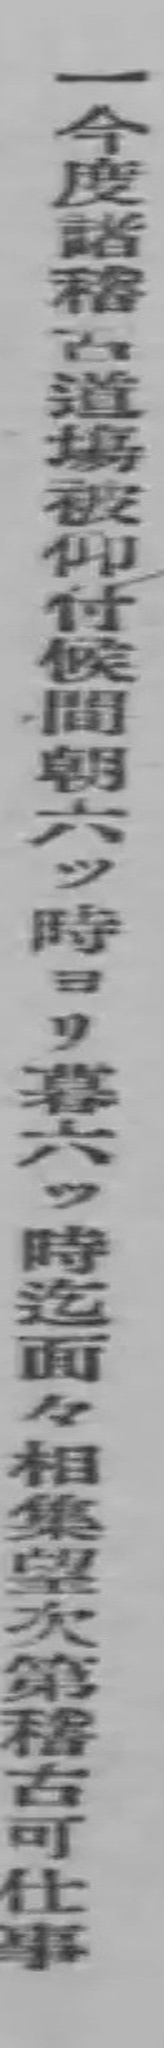一今度諸稽古道場被仰付候間朝六ツ時ヨリ暮六ツ時迄面々相集望次第稽古可仕事
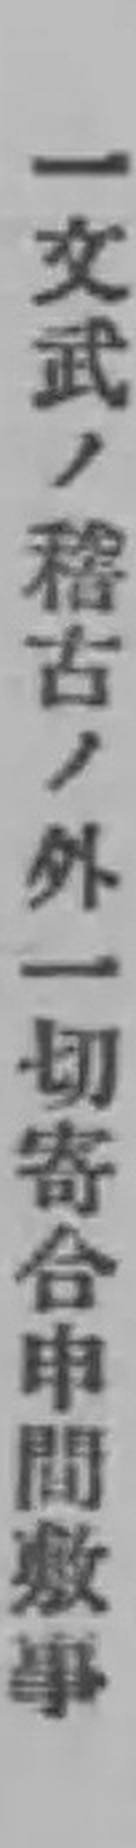一文武ノ稽古ノ外一切寄合申間敷事
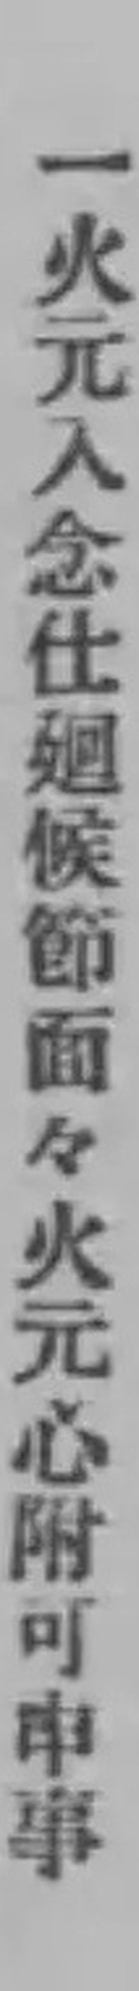一火元入念仕廻候節面々火元心附可申事
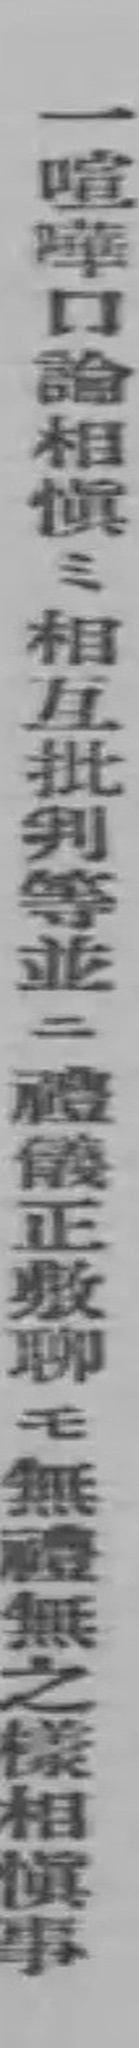一喧嘩口論相慎ミ相互批判等並ニ礼儀正敷聊モ無礼無之様相慎事
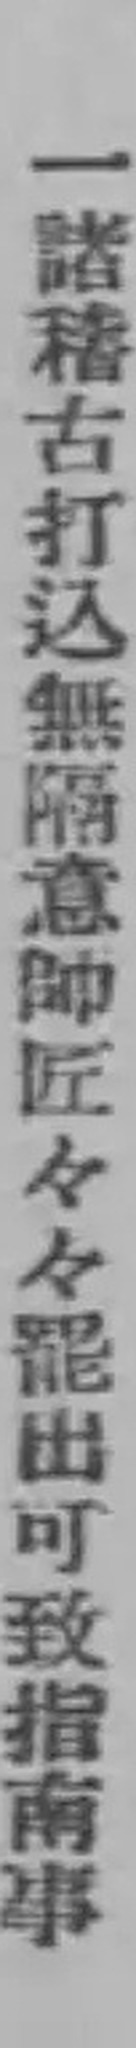一諸稽古打込無隔意師匠々々罷出可致指南事
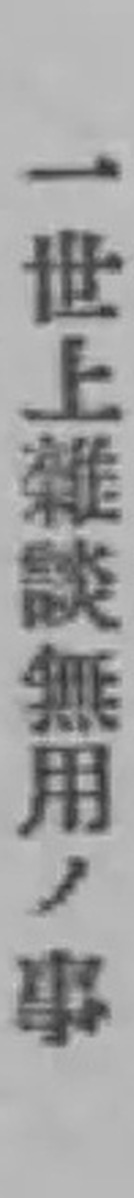一世上雑談無用ノ事
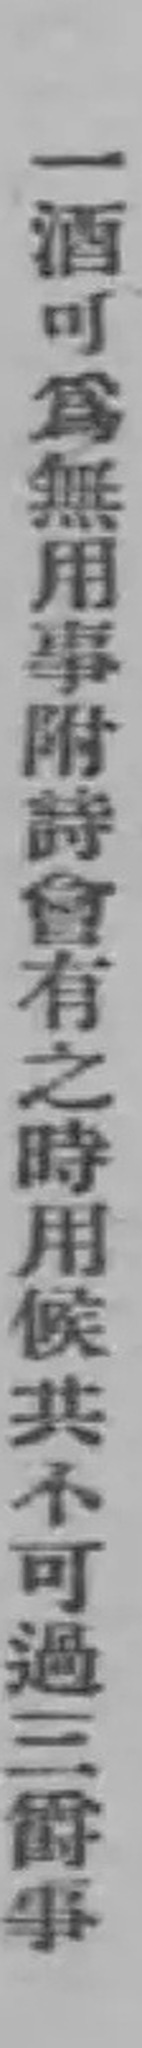一酒可為無用事附詩会有之時用候共不可過三爵事
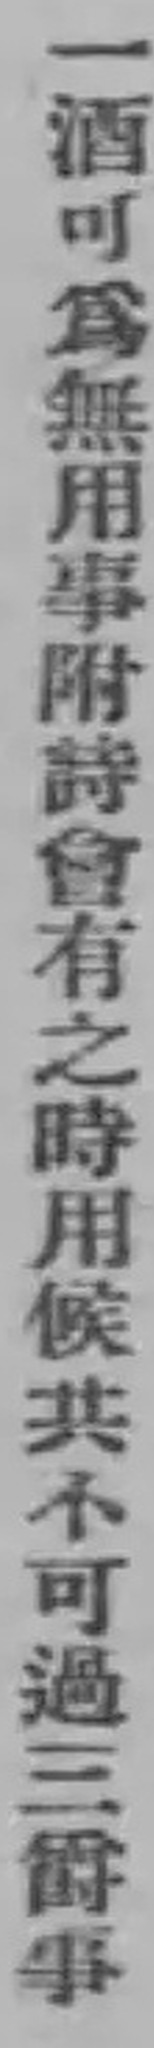一酒可為無用事附詩会有之時用候共不可過三爵事
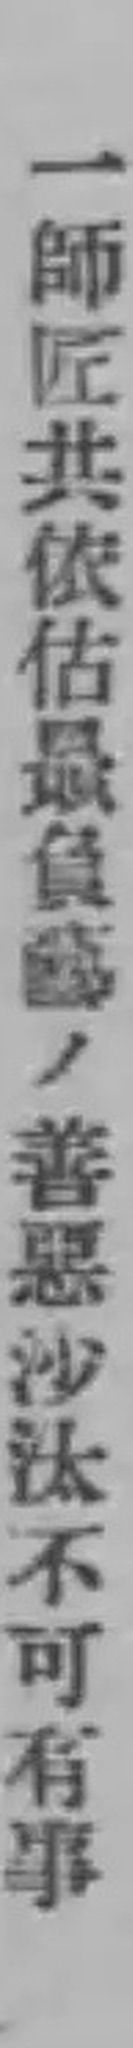一師匠共依估贔負芸ノ善悪沙汰不可有事
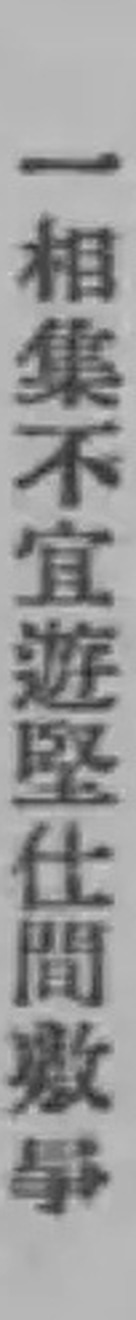一相集不宜遊堅仕間敷事
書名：豊橋市史談
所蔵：国立国会図書館 National Diet Library, JAPAN
